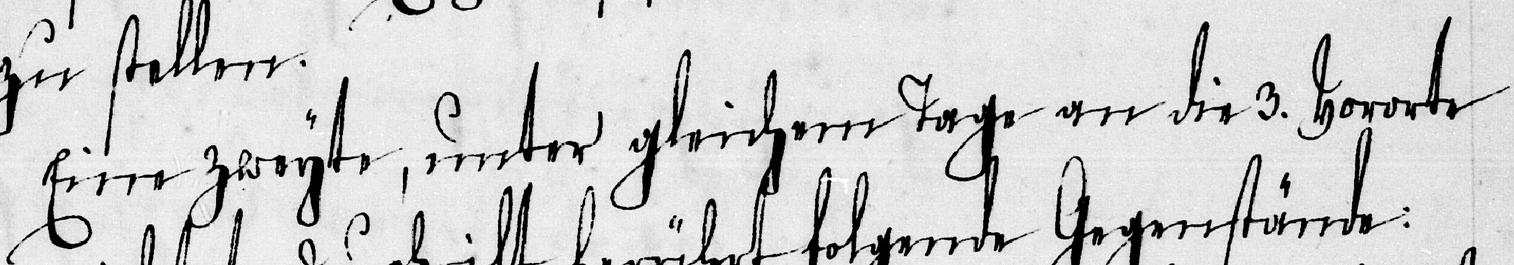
Eine zweyte, unter gleichem Tage an die 3. Vororte
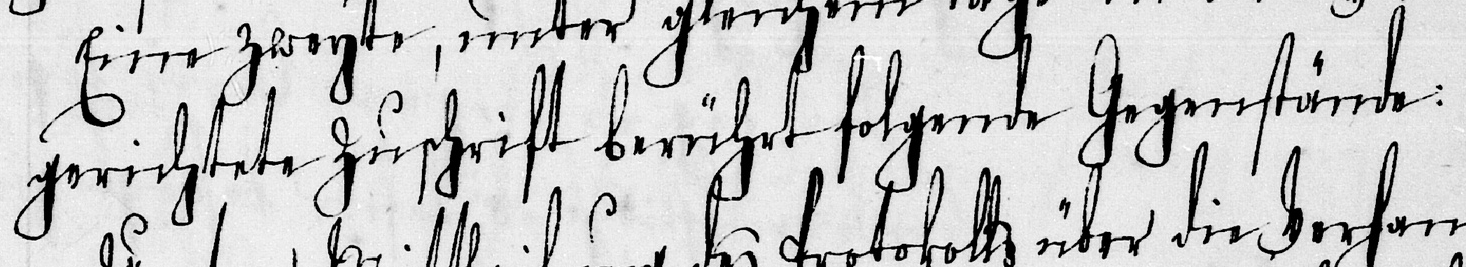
gerichtete Zuschrift berührt folgende Gegenstände:
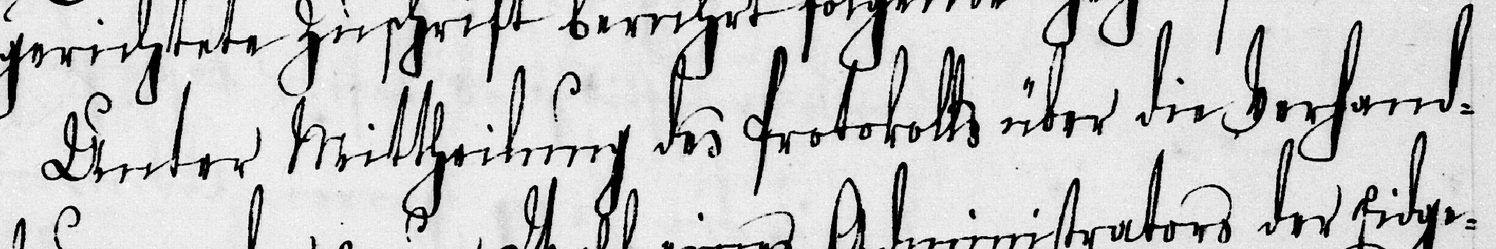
Unter Mittheilung des Protokolls über die Verhand¬
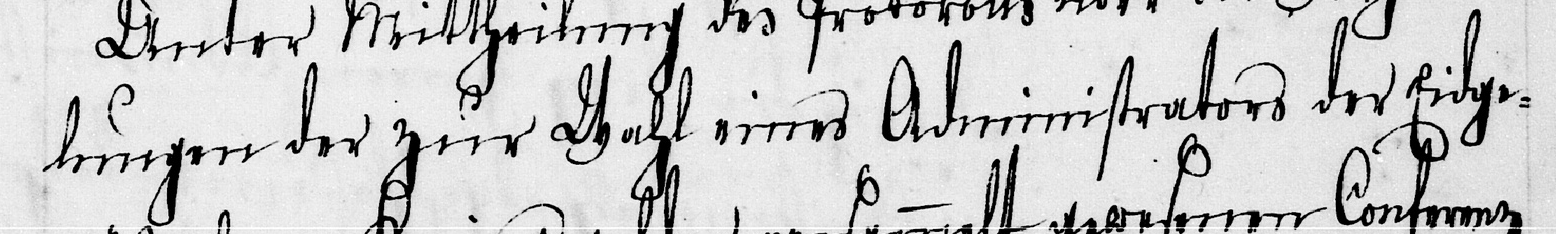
lungen der zur Wahl eines Administrators der Eidge¬
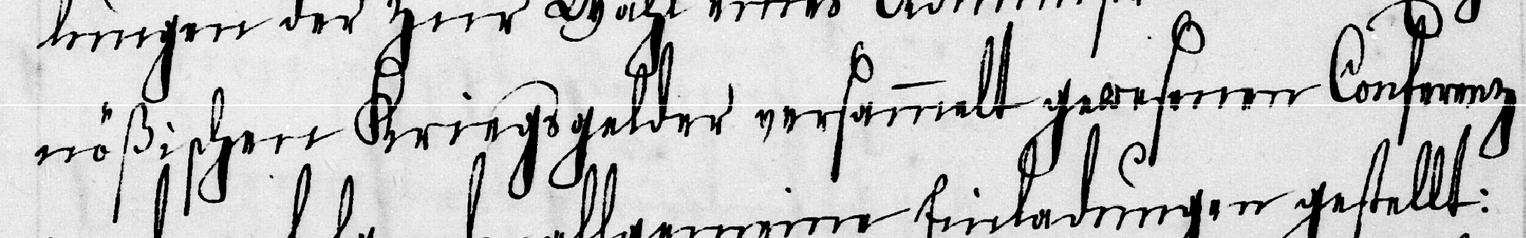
nößischen Kriegsgelder versammelt gewesenen Conferenz
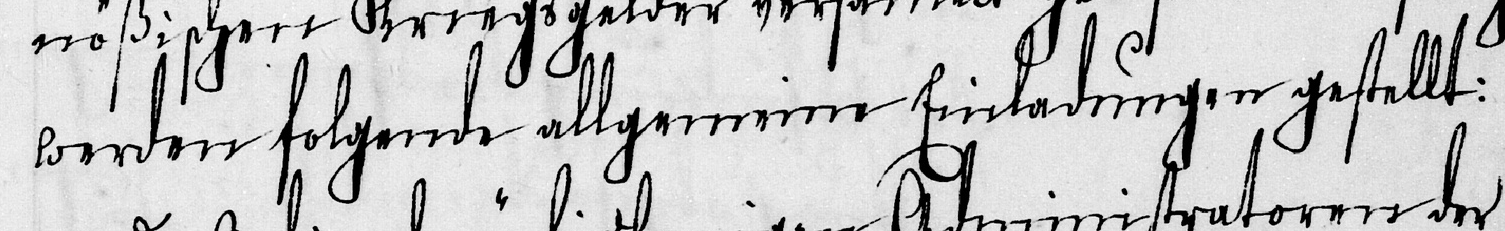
werden folgende allgemeine Einladungen gestellt:
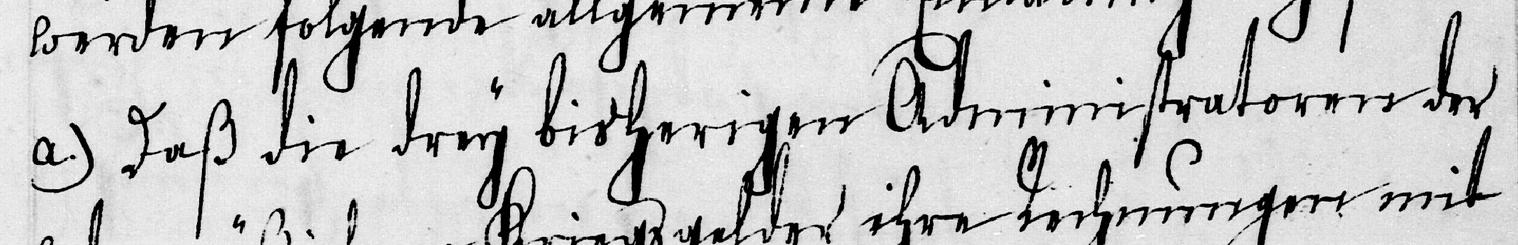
a.) Daß die drey bisherigen Administratoren der
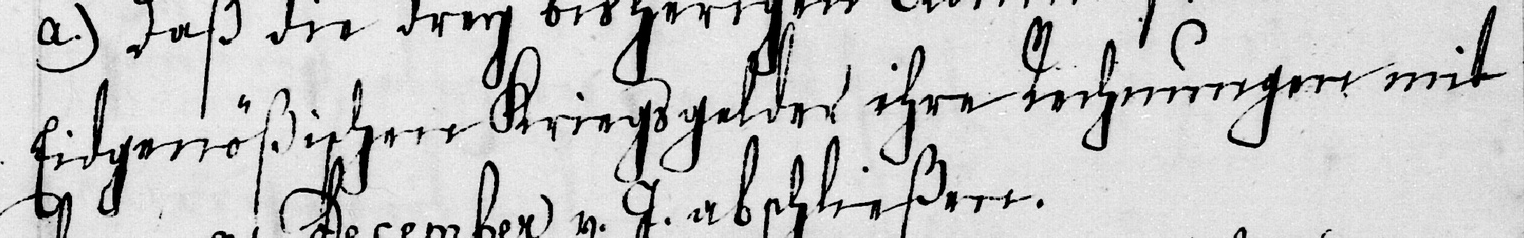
Eidgenößischen Kriegsgelder ihre Rechnungen mit
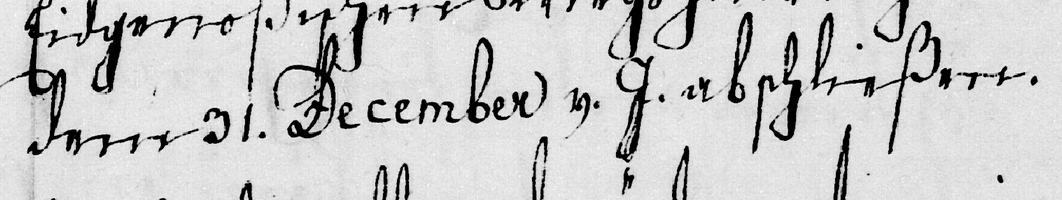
dem 31. December v. J. abschließen.
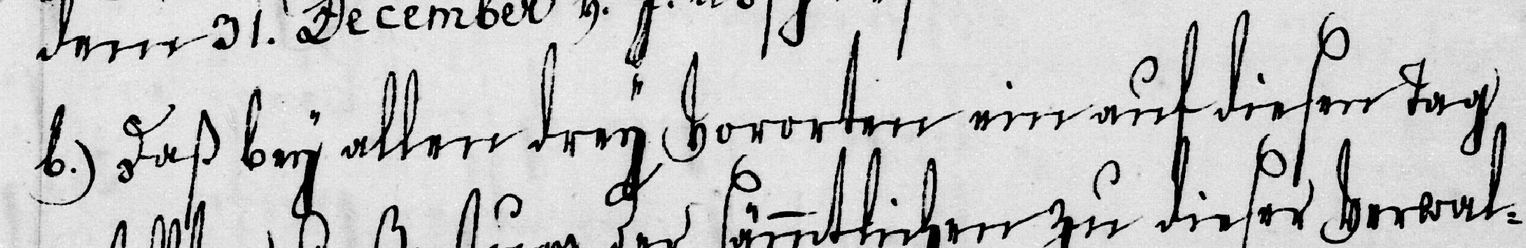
b.) Daß bey allen drey Vororten ein auf diesen Tag
